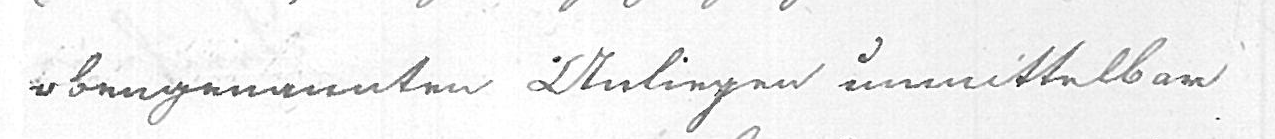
obengenannten Anliegen unmittelbar
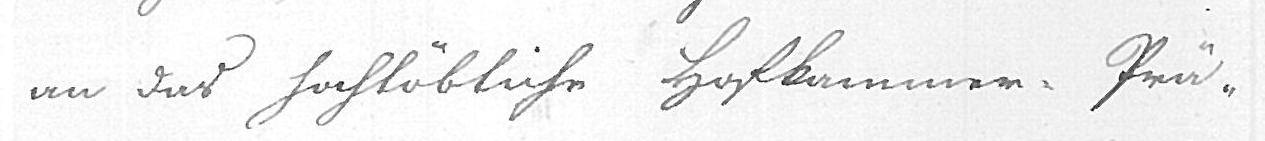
an das hochlöbliche Hofkammer-Prä-
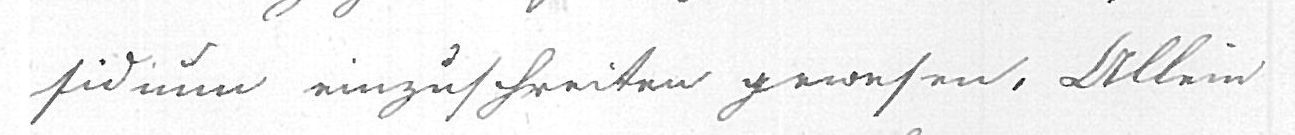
sidium einzuschreiten gewesen. Allein
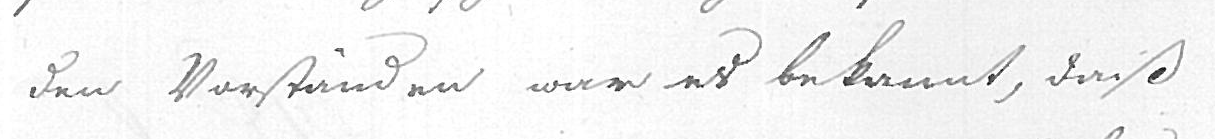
den Vorständen war es bekannt, daß
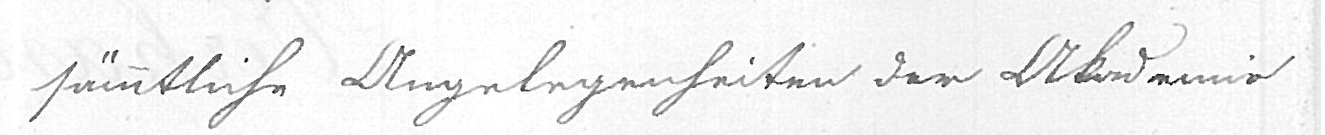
sämmtliche Angelegenheiten der Akademie
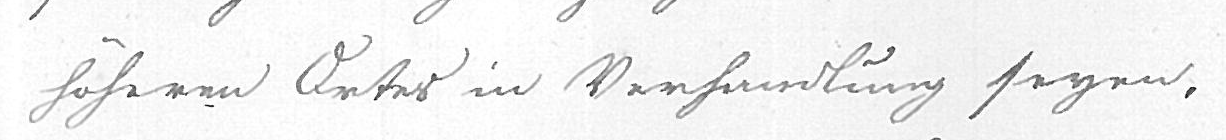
höheren Ortes in Verhandlung seyen,
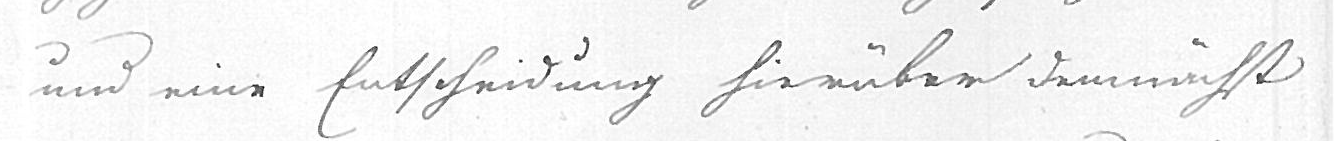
und eine Entscheidung hierüber demnächst
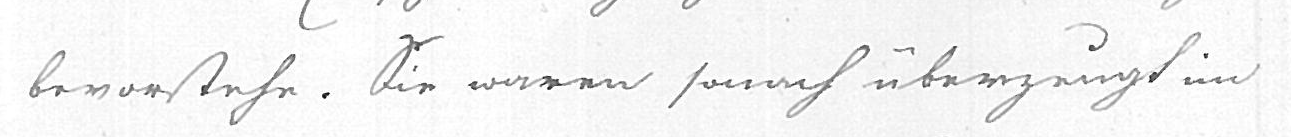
bevorstehe. Sie waren sonach überzeugt im
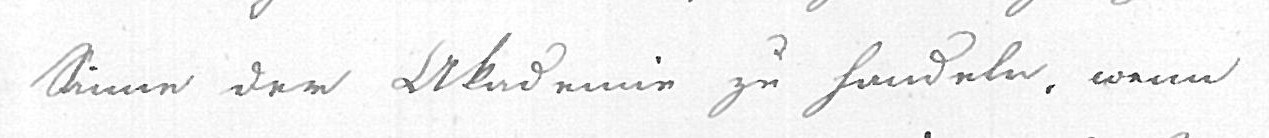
Sinn der Akademie zu handeln, wenn
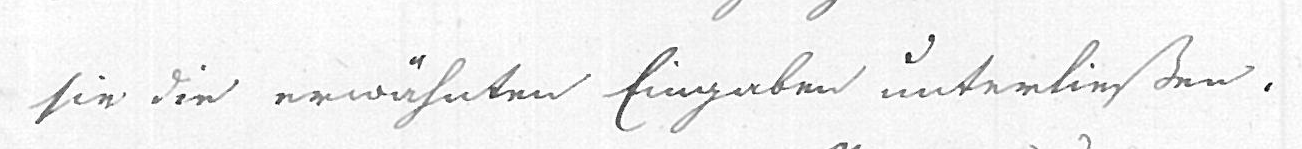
sie die erwähnten Eingaben unterließen.
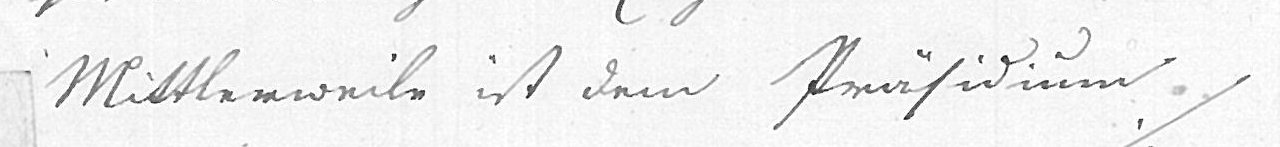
Mittlerweile ist dem Präsidium
